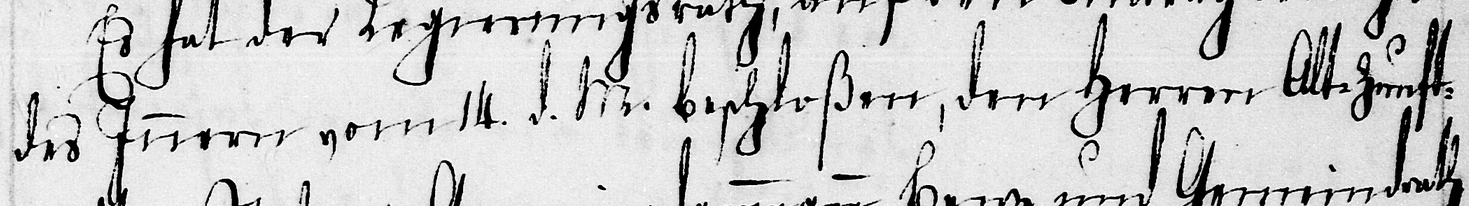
des Innern vom 14. d. M. beschloßen, den Herren Alt-Zunft¬
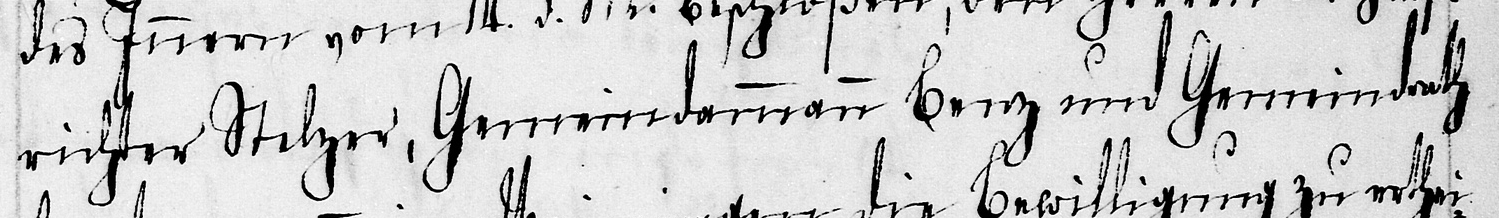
richter Stelzer, Gemeindammann Benz und Gemeindrath
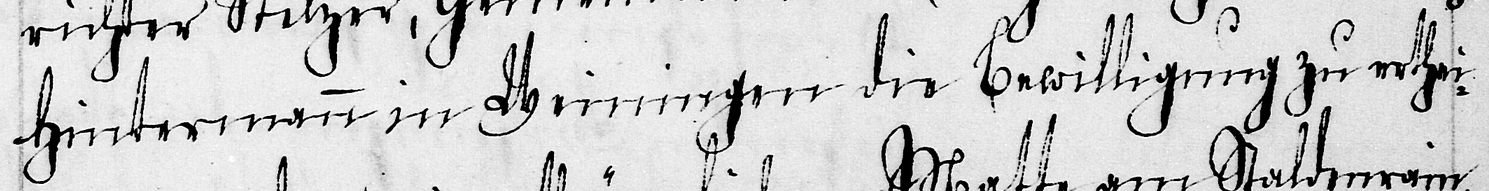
Hintermann in Weinigen die Bewilligung zu erthei¬
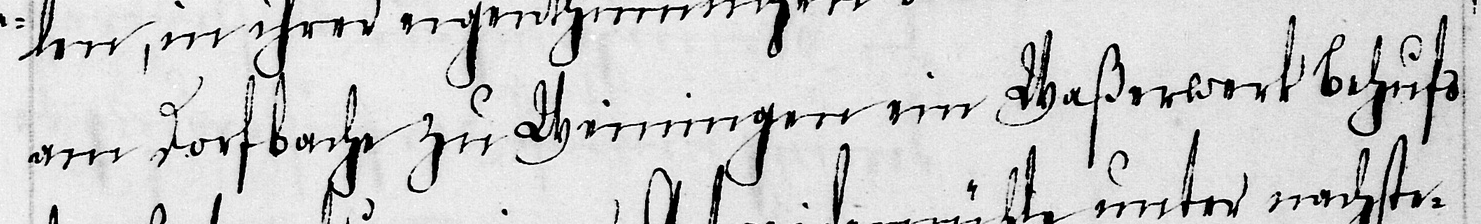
am Dorfbache zu Weiningen ein Waßerwerk Behufs
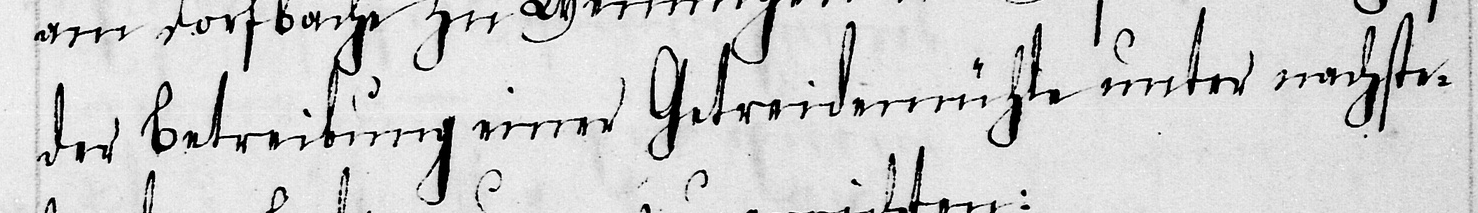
der Betreibung einer Getreidemühle unter nachste¬
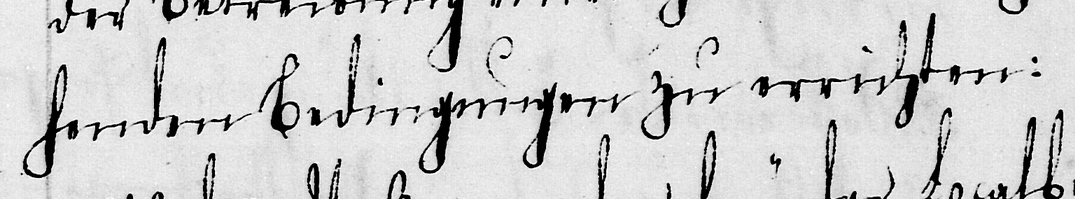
henden Bedingungen zu errichten:
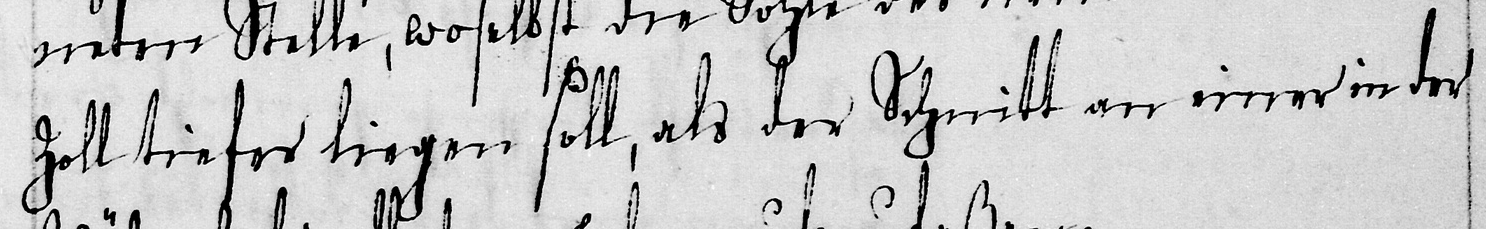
Zoll tiefer liegen soll, als der Schnitt an einer in der
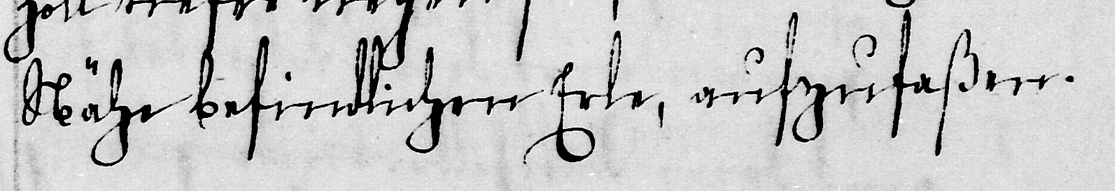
Nähe befindlichen Erle, aufzufaßen.
